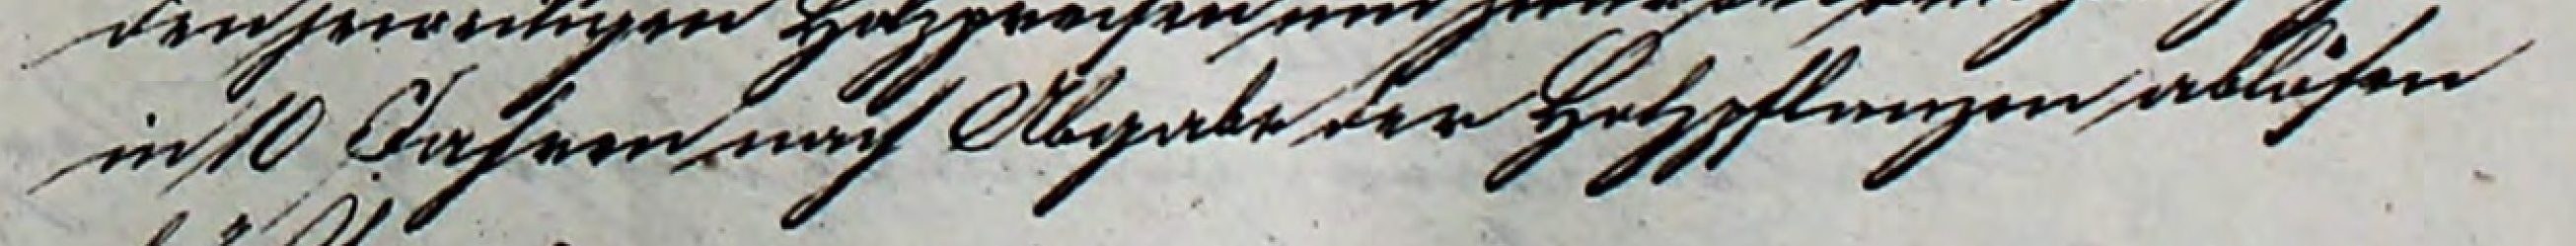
in 10 Jahren nach Abgabe der Holzpflanzen ablösen
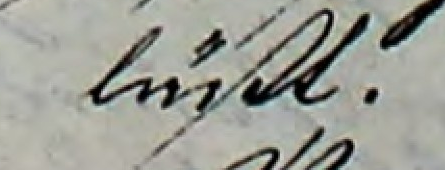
läßt.
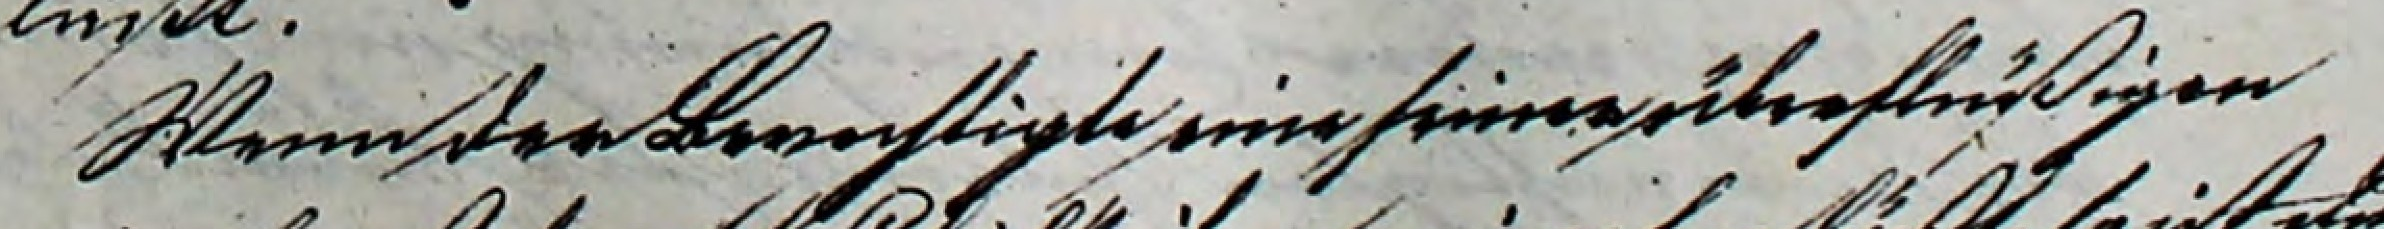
Wenn der Berechtigte eine seiner überflüßigen
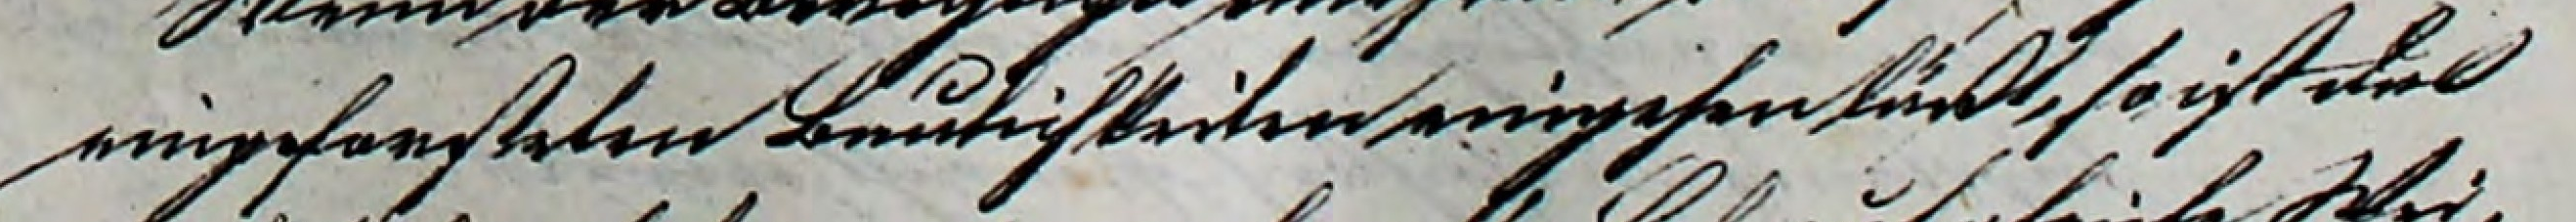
eingeforsteten Baulichkeiten eingehen läßt, so ist das
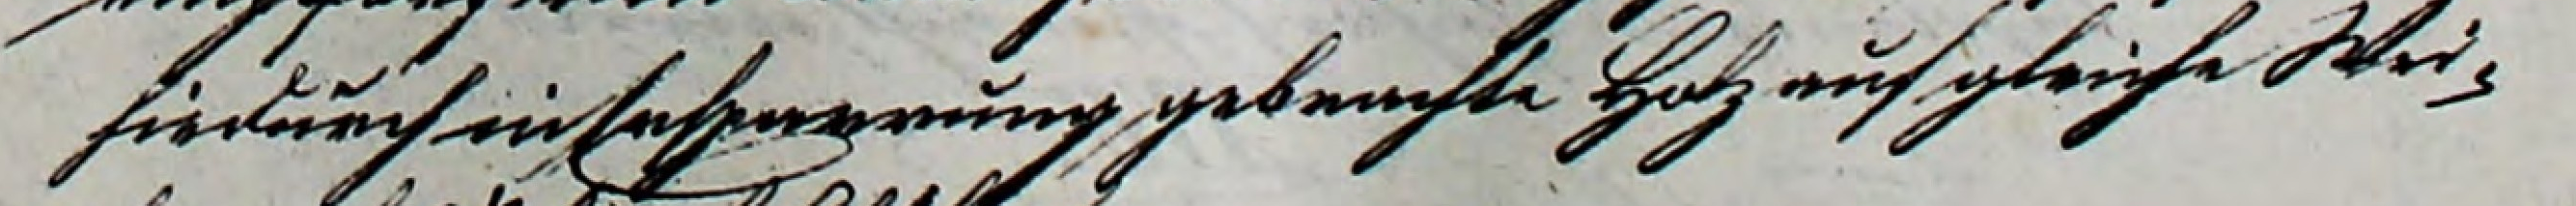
hiedurch in Ersparrung geb nachte Holz auf gleiche Wei„
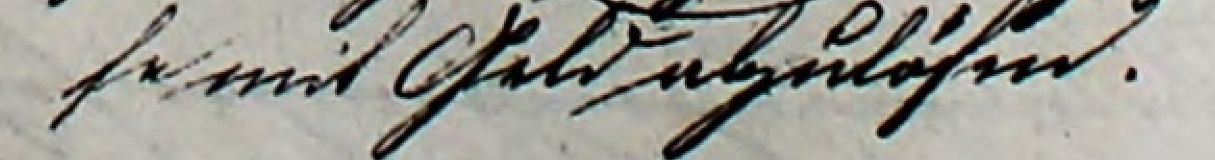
se mit Geld abgulöhen.
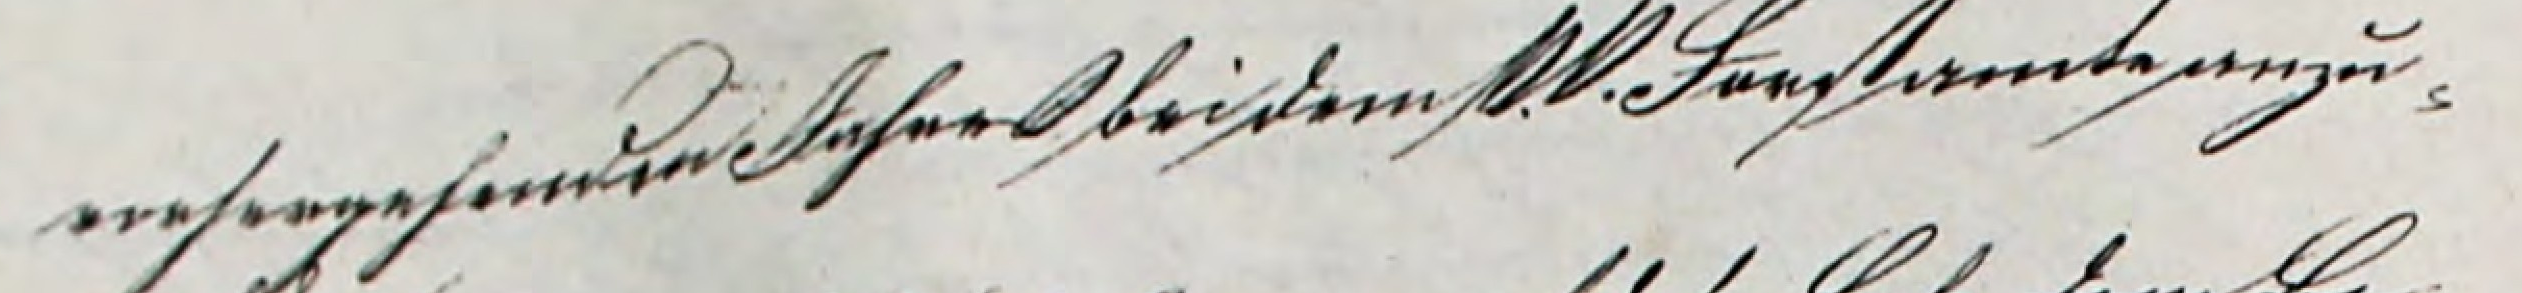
wehergehenden Jahres bei dem k.k. Forstamte anzu„
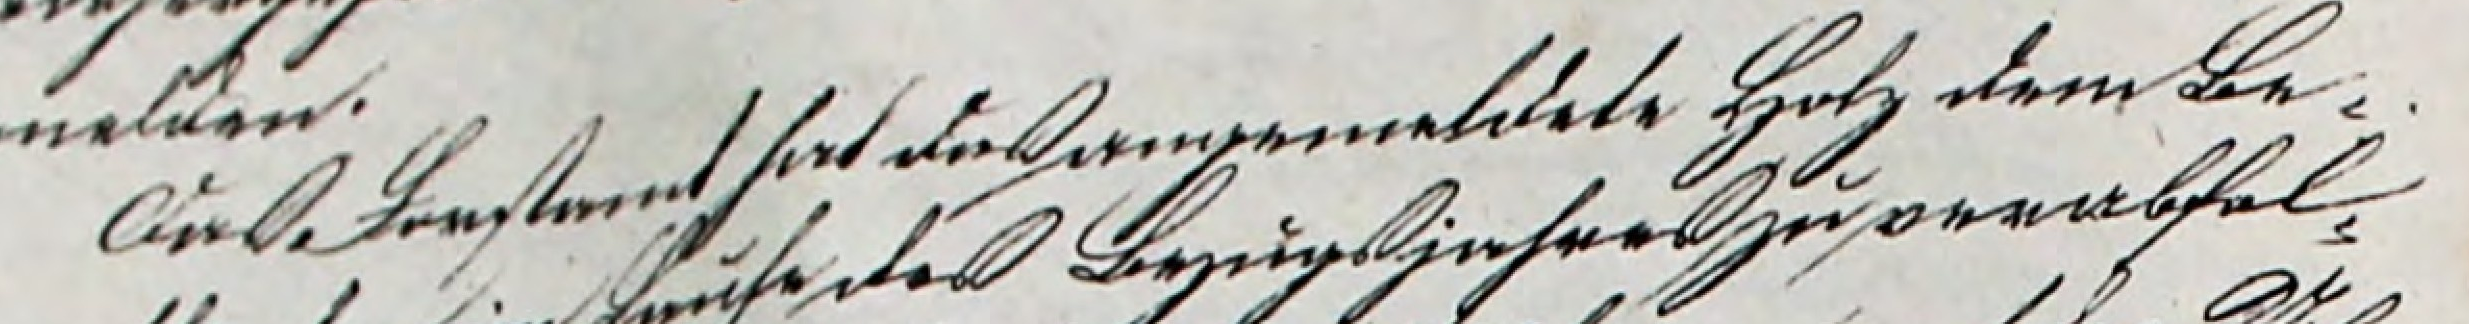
melden.
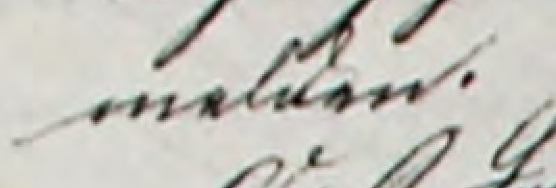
Das Forstamt hat das angemeldete Holz dem Be„
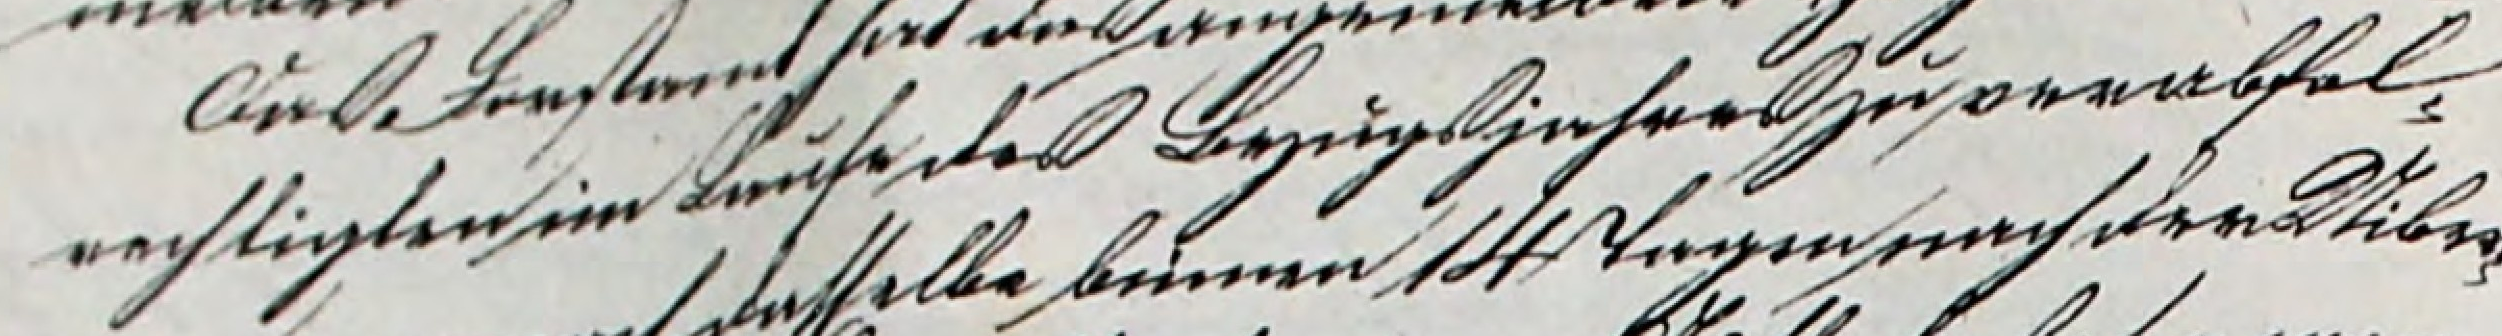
rechtigten im Lause des Bezugsjahres zu verabfol„
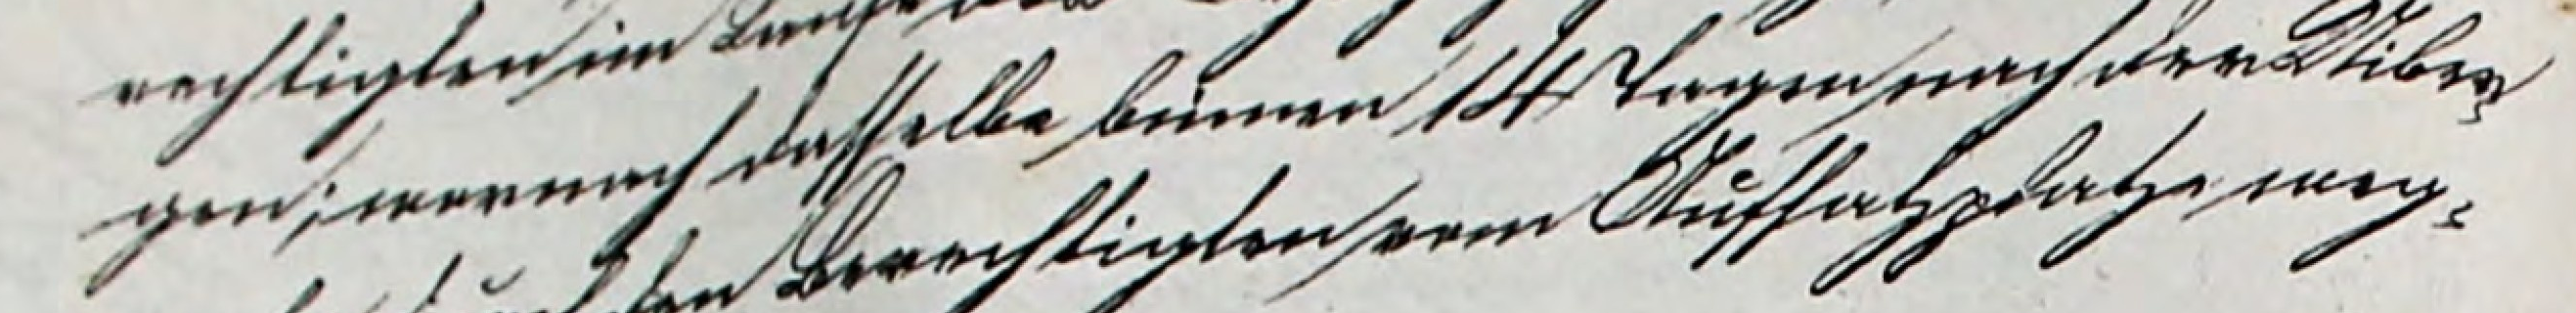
gen; wernach dasselbe binnen 14 Tagen nach der Uiber„
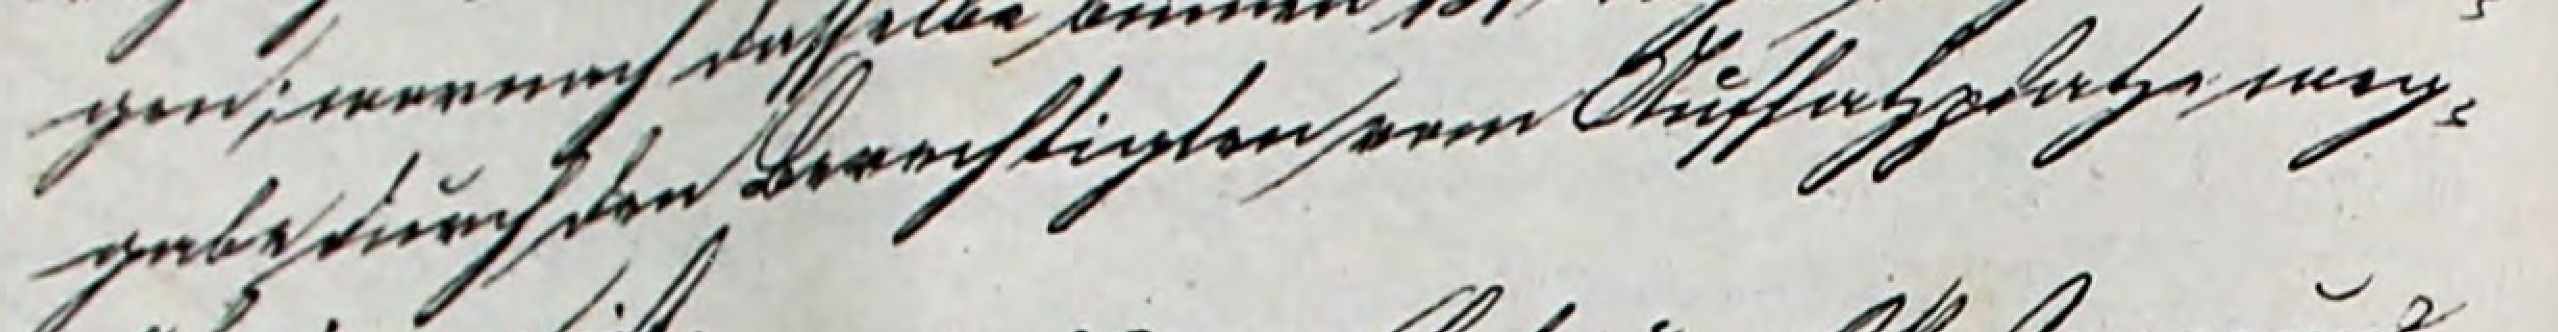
gabe durch den Berechtigten vom Aufsatzplatze meg„
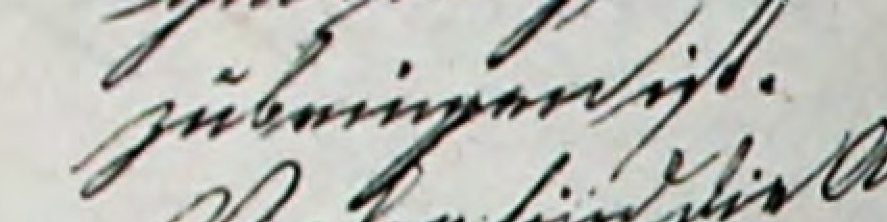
zubeingen ist.
